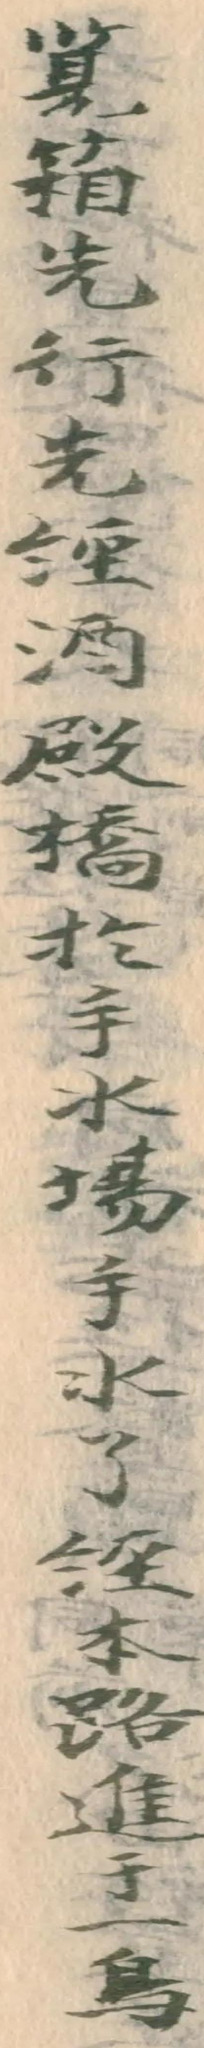覧籍先行先経酒殿橋於手水場手水了経本路進于一鳥
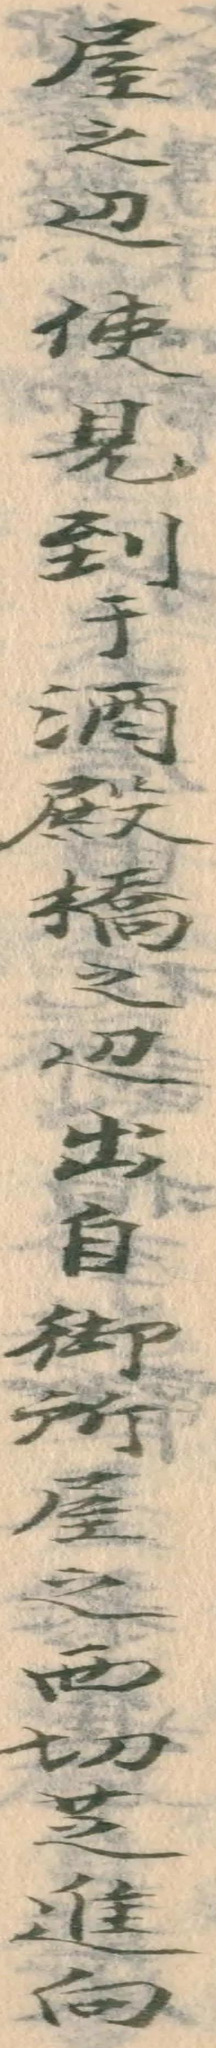屋之辺使見到于酒殿橋之辺出自御所屋之西切芝進向
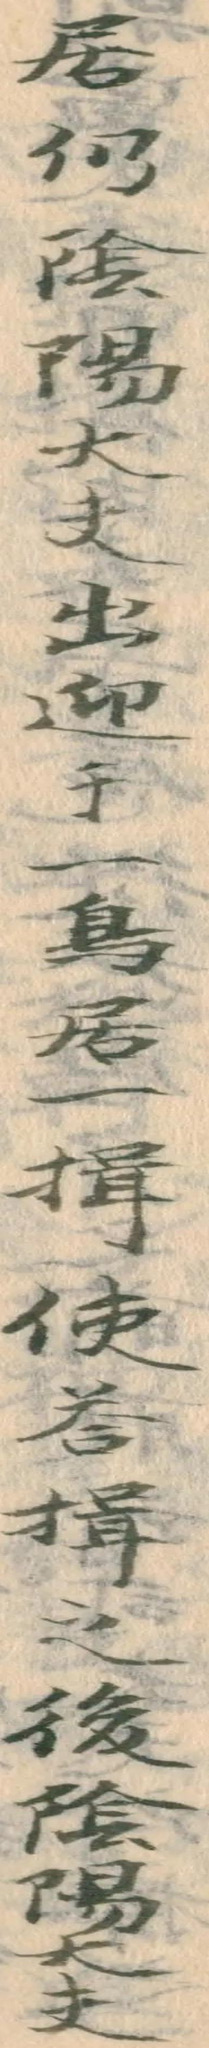居仍陰陽大夫出迎于一鳥居一揖使答揖之後陰陽大夫
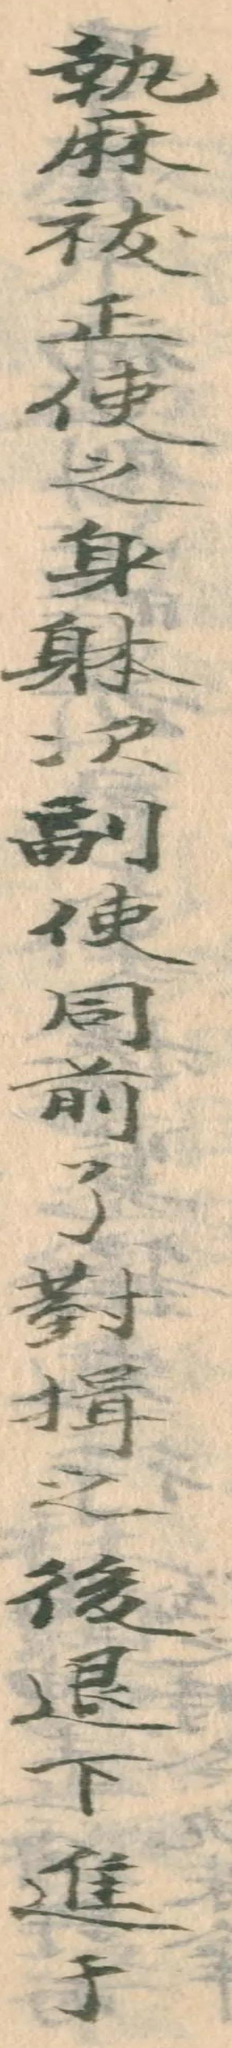執麻祓正使之身体次副使同前了対揖之後退下進于

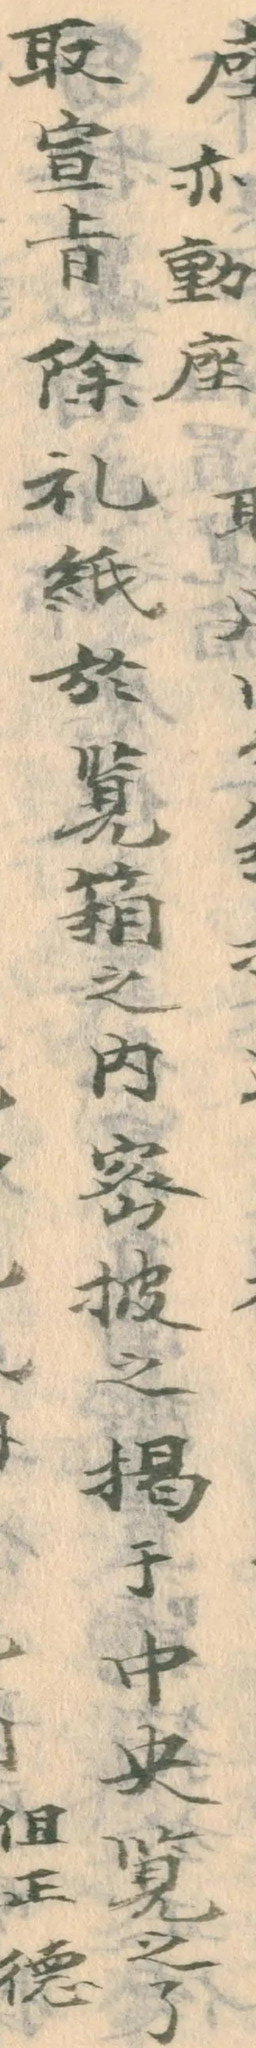取宣旨除礼紙於覧箱之内密披之掲于中央覧之了
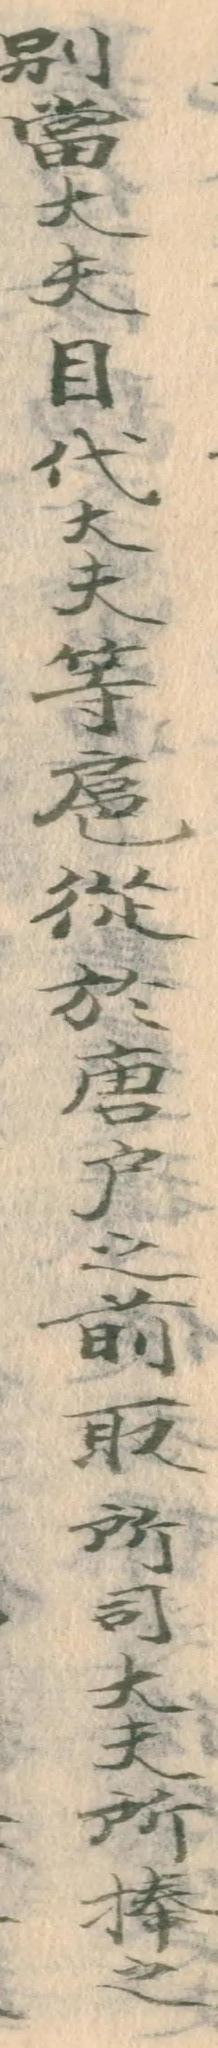別当大夫目代大夫等扈従於唐戸之前取所司大夫所捧之
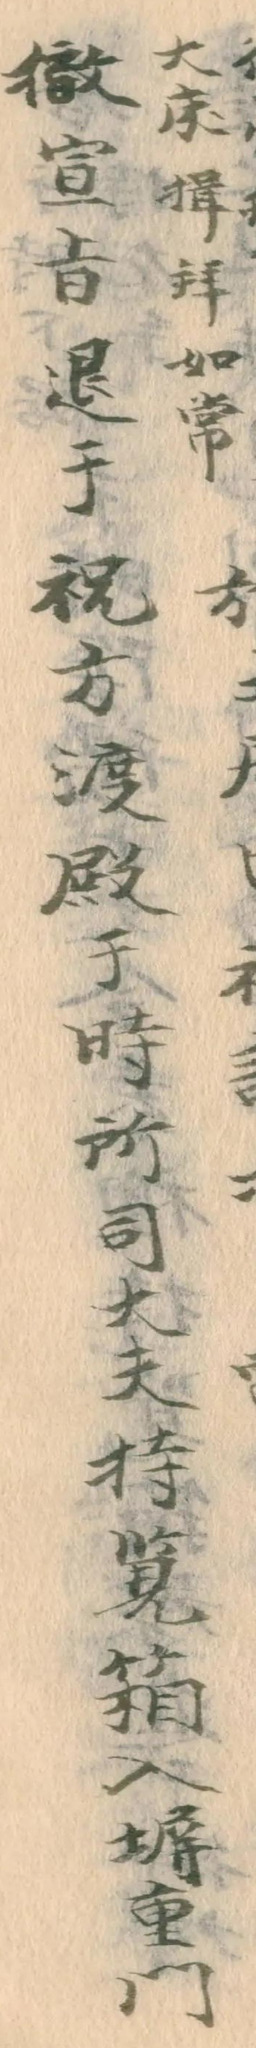徹宣旨退于祝方渡殿于時所司大夫持覧箱入塀重門
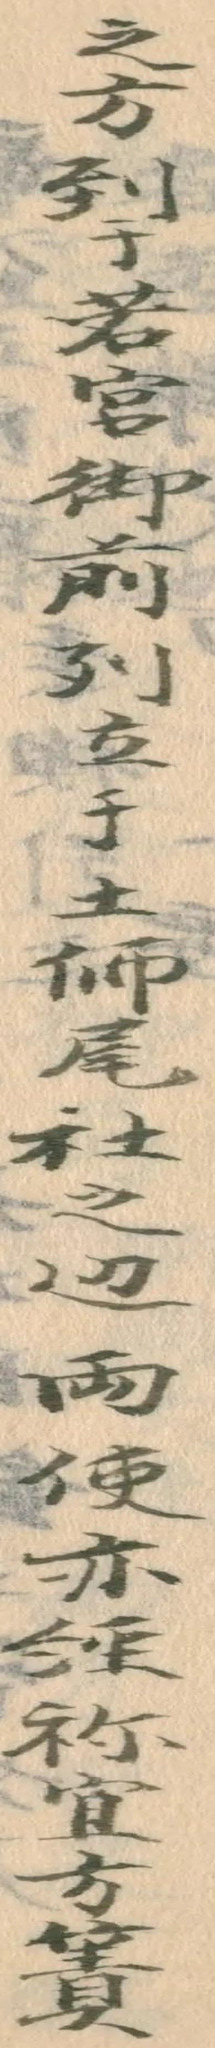之方到于若宮御前列立于土師尾社之辺両使亦経祢宜方簀
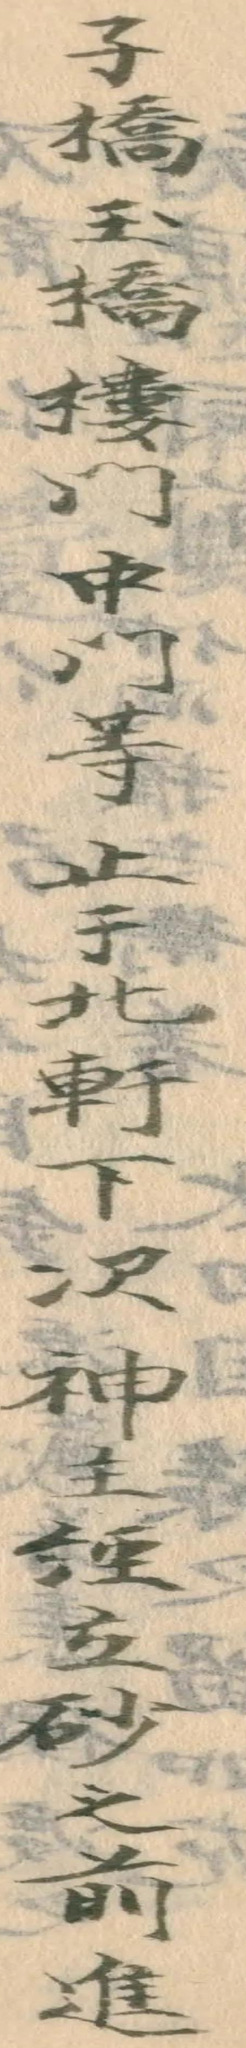子橋玉橋楼門中門等止于北軒下次神主経立砂之前進
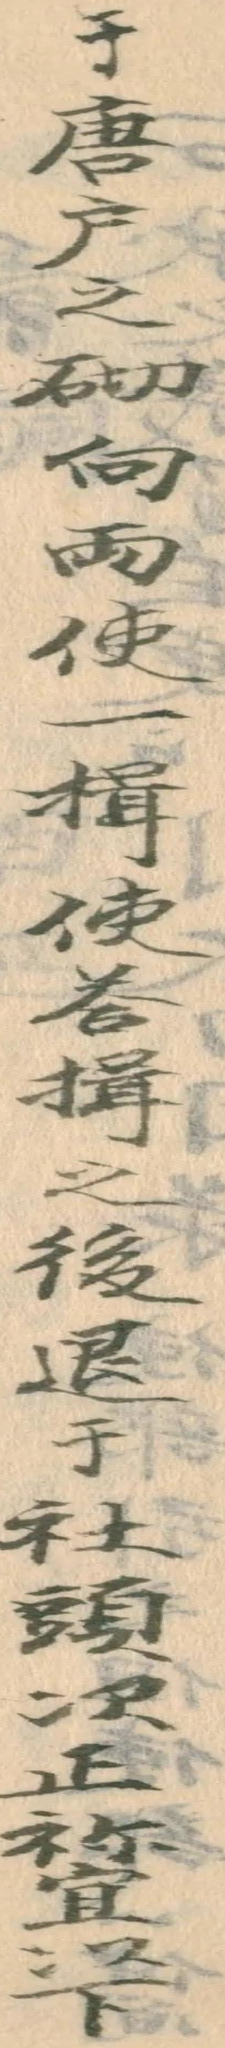于唐戸之砌向両使一揖使答揖之後退于社頭次正祢宜以下
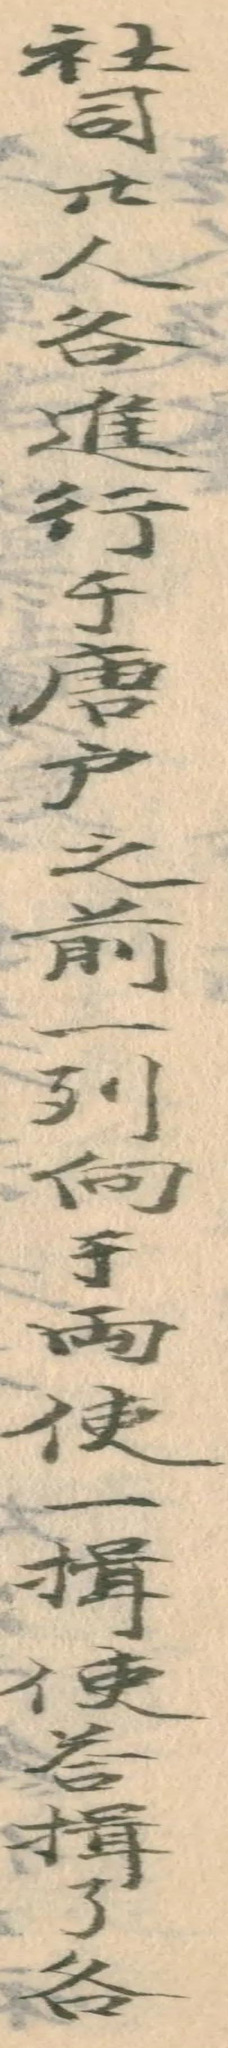社司廿人各進行于唐戸之前一列向于両使一揖使答揖了各

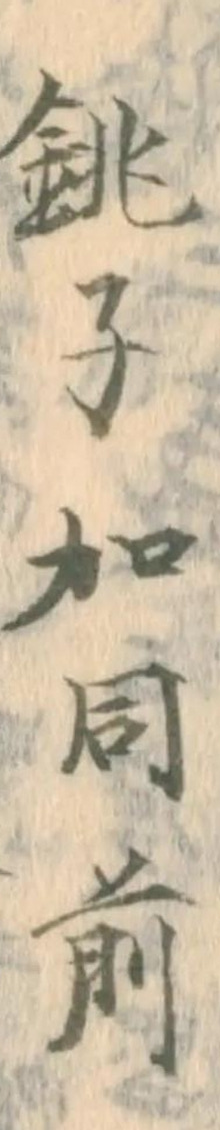銚子加同前
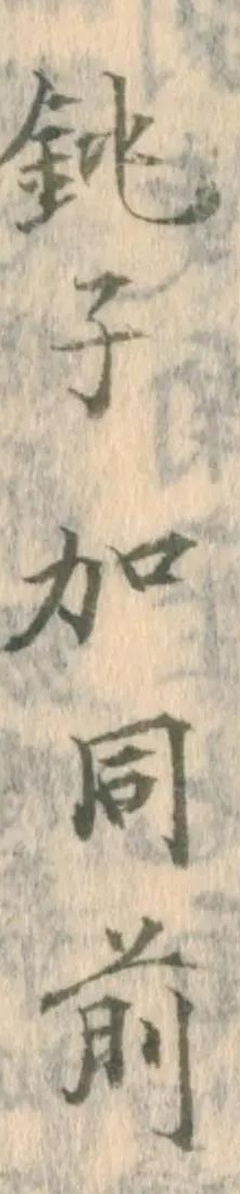銚子加同前
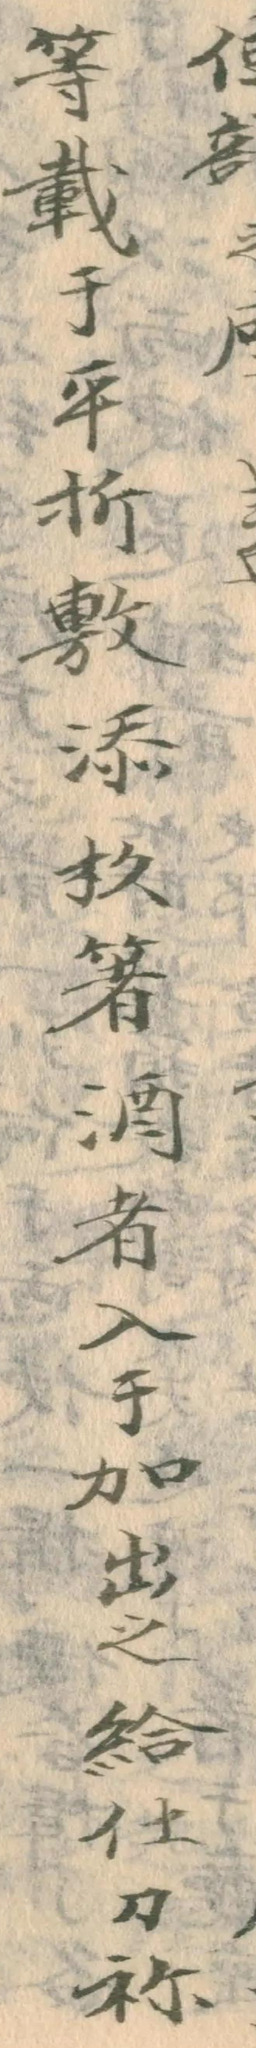等載于平折敷添杦箸酒者入于加出之給仕刀祢
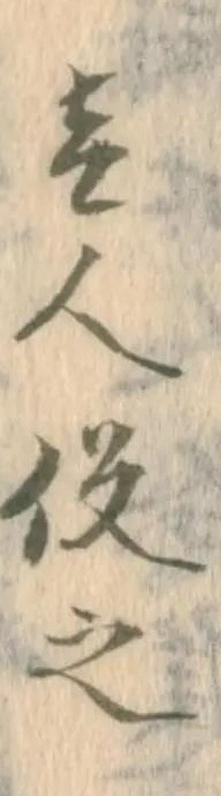壱人役也
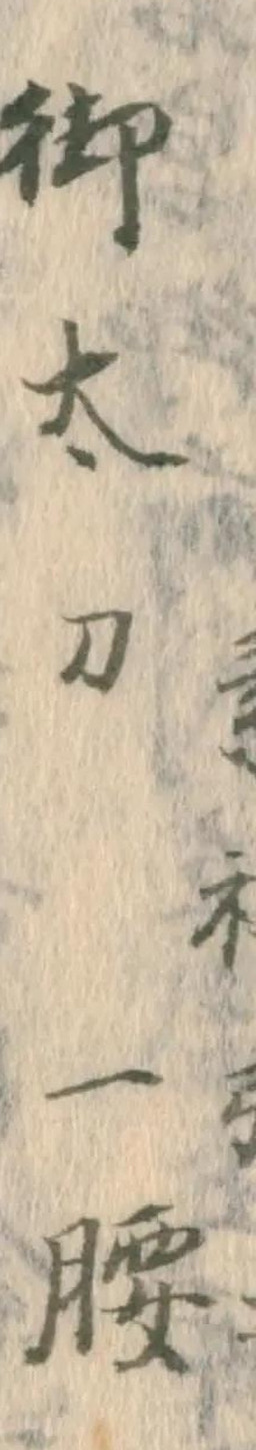御太刀一腰
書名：賀茂社記録. 第17冊
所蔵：国立国会図書館 National Diet Library, JAPAN
